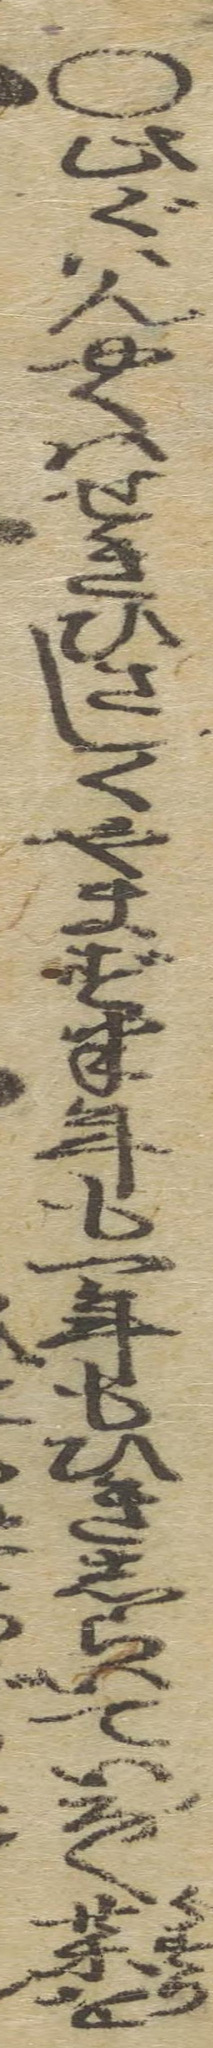〇此ぐはんやくはせきひさしくやまず半年も一年もひきしらいていろ〳〵薬を
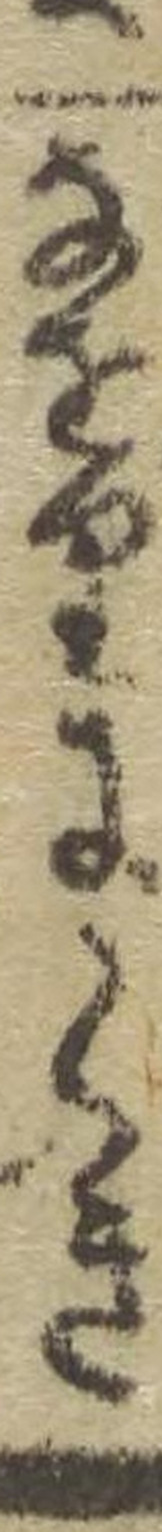なをりにくき
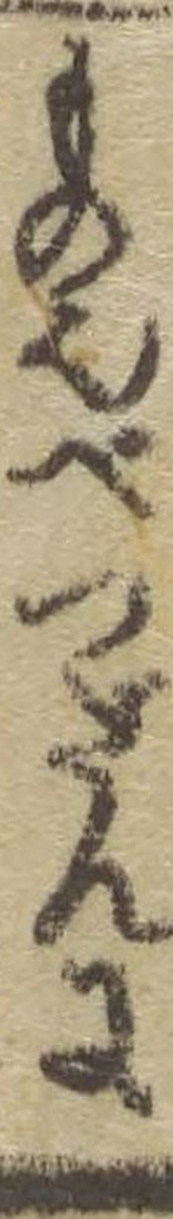もの也べつだんに
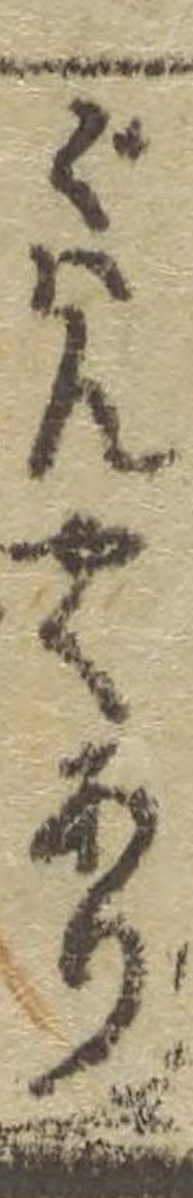ぐはんやくあり
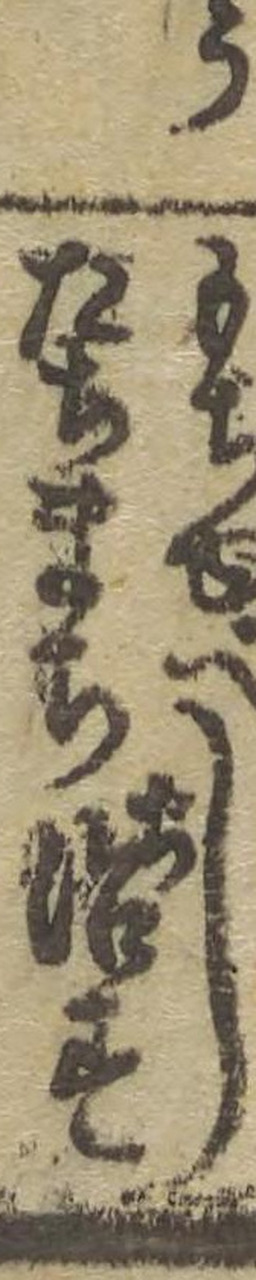たちまち治す
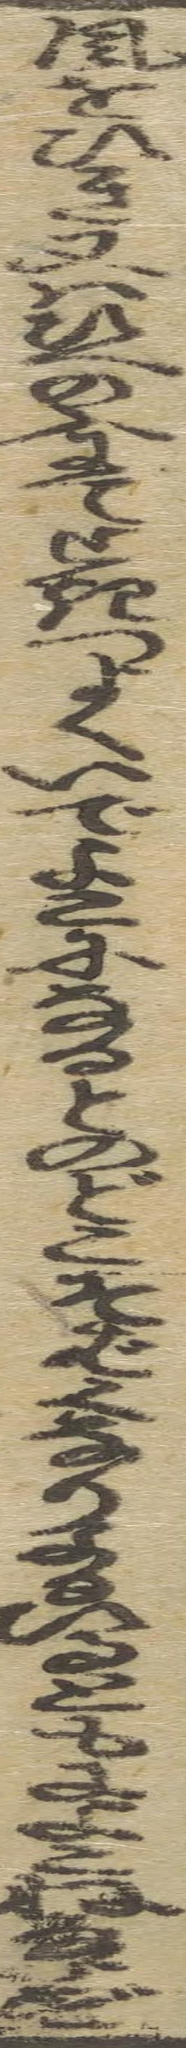風をひき又はひへの入にてせきつよくいでよこになるとのどこそばくなりよるひるともによこねならず
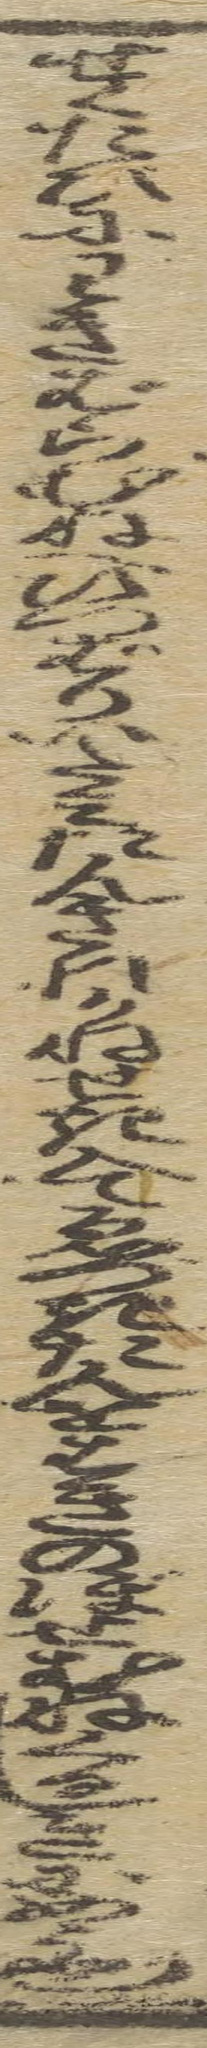せくたびにわきばらむねへひつぱりいたみたんきれかねせき入てゑつきたんをはきのぼせむねくるしきにめう也
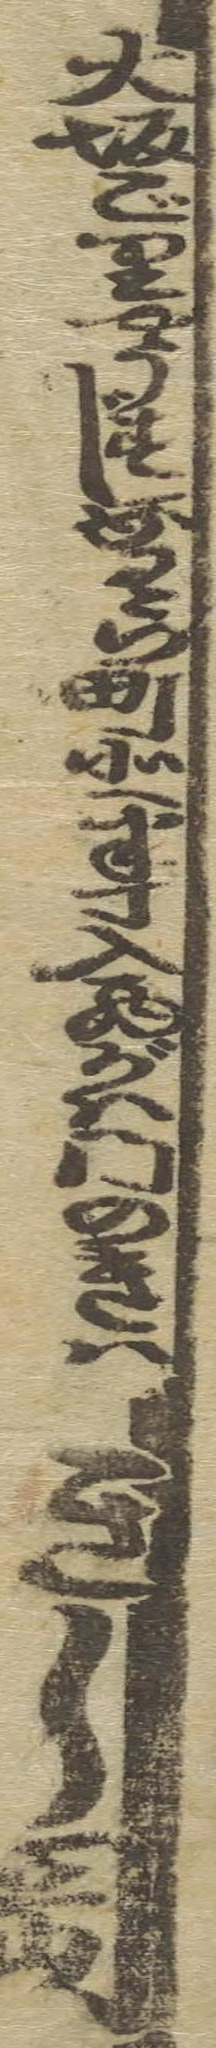大坂ごりやうすじかわら町北へ半丁入西がは門のきはきし岡
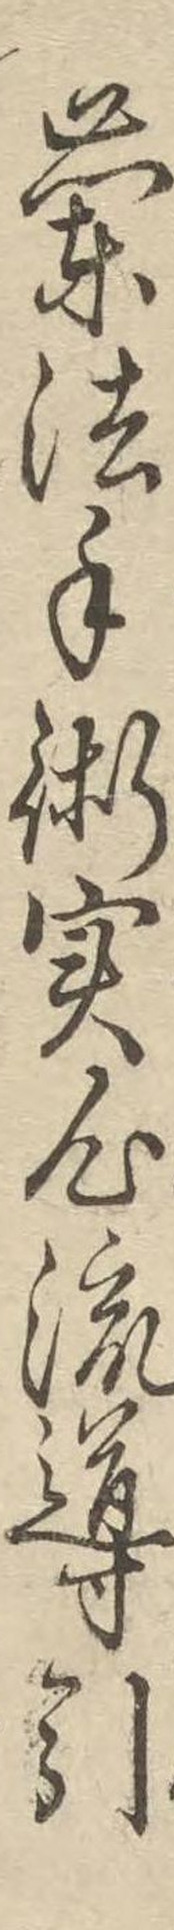蘭法手術実心流導引
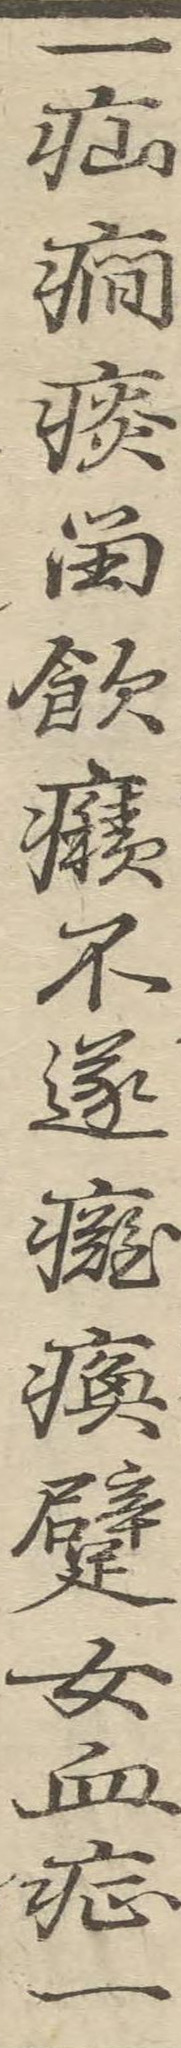一疝癇痰留飲癪不遂癱瘓躄女血症一
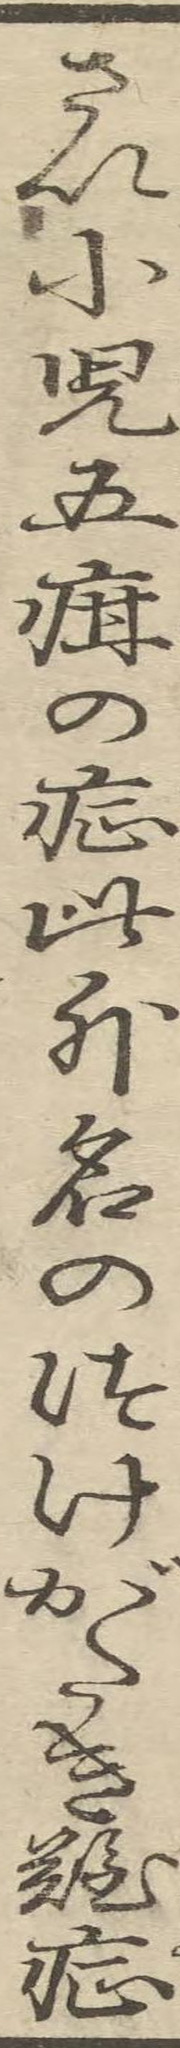さい小児五疳の症此外名のつけがたき難症
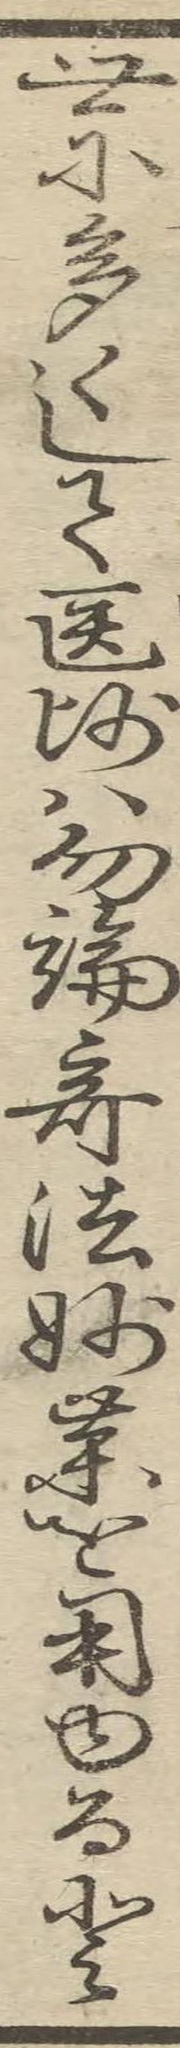世に多くして医師は勿論奇法妙薬を用ゆると
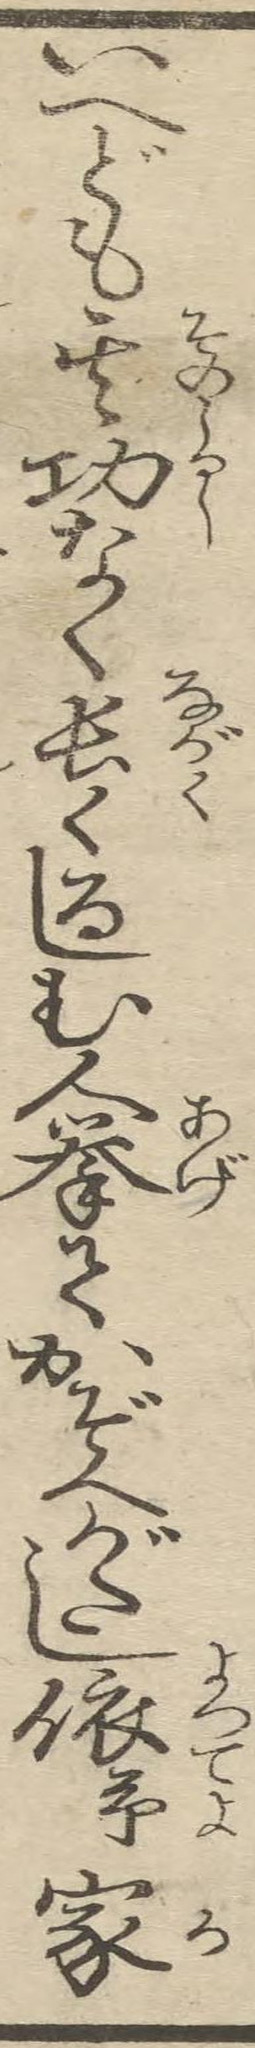いへども其功なく長くるしむ人挙てかぞへがたし依予家
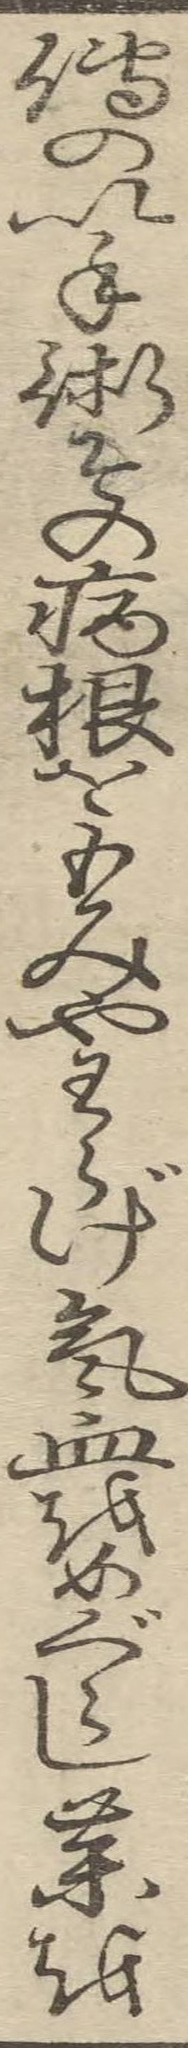傳の以手術その病根をもみやわらげ気血をめぐらし薬を
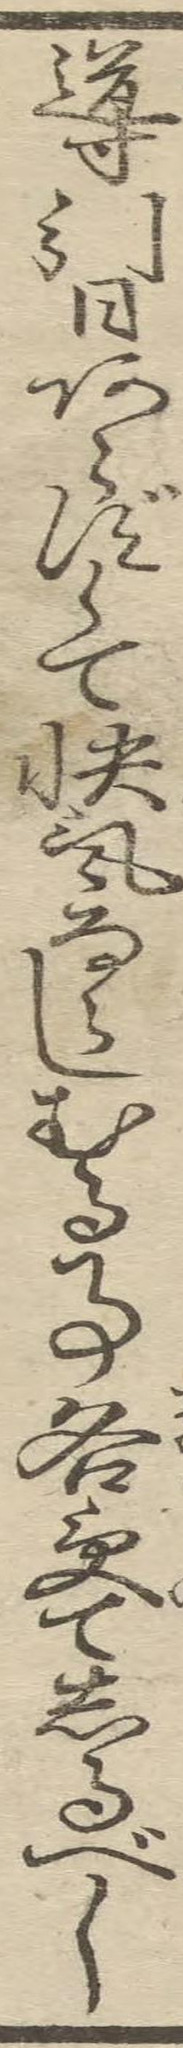導引日あらずして快気ならしむる事各受てしるべし
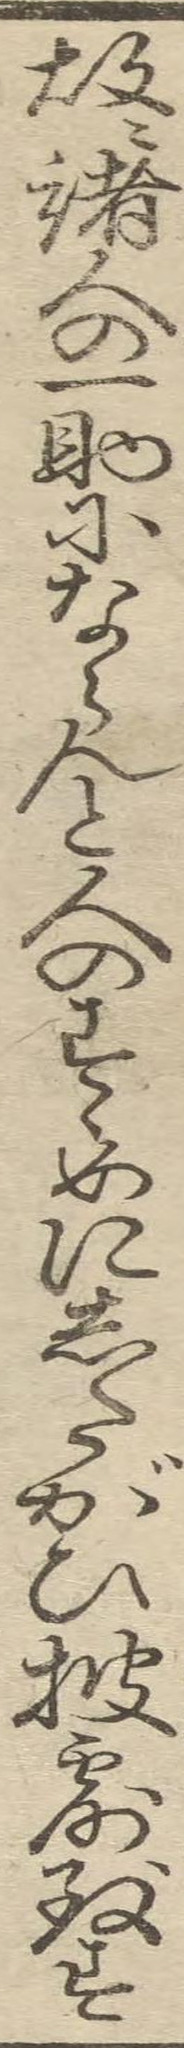故ニ諸人の一助にならんと人のすゝめにしたがひ披露致す
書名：浪華薬種問屋能書張交帖. 二
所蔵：国立国会図書館 National Diet Library, JAPAN
